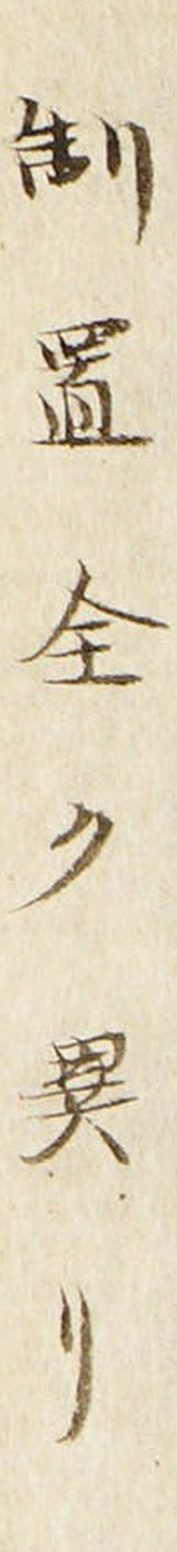制置全ク異リ

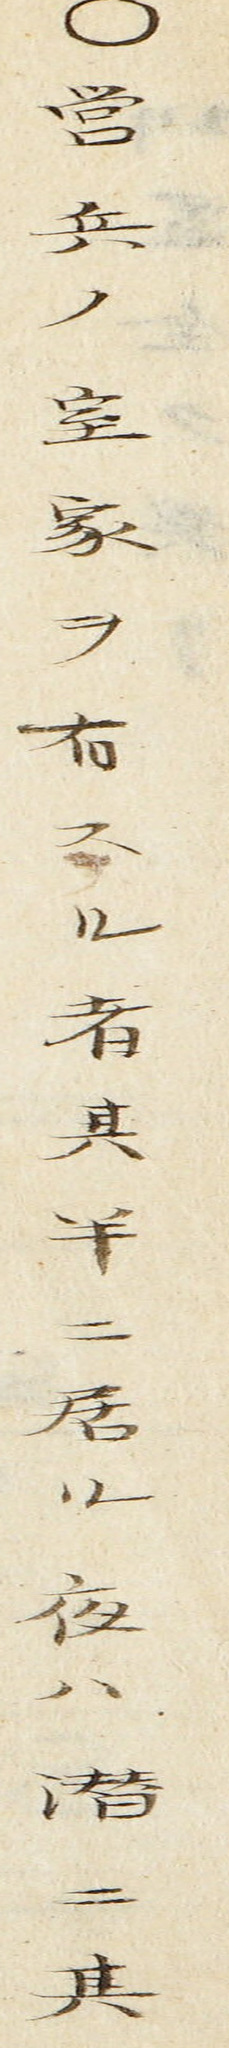○営兵ノ室家ヲ有スル者其半ニ居ル夜ハ潜ニ其
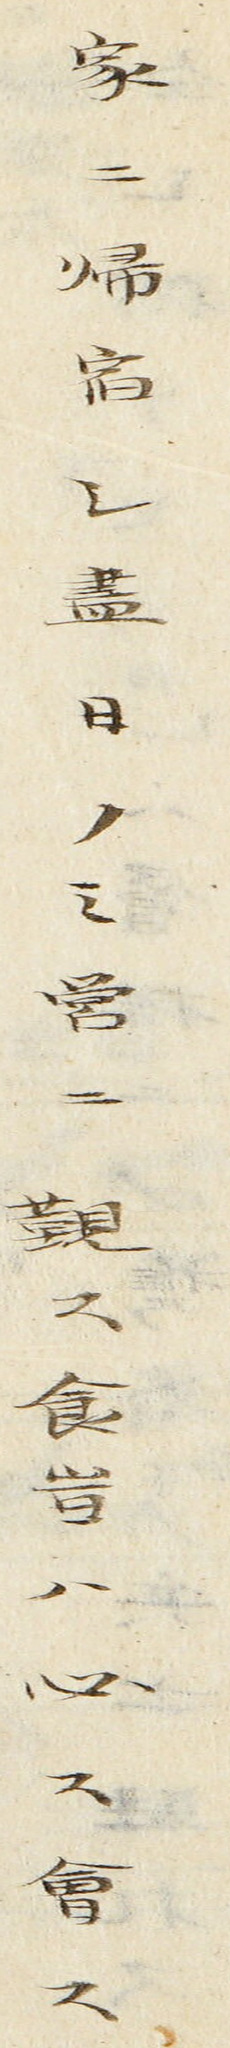家ニ帰宿シ尽日ノミ営ニ覲ス食旹ハ必ス会ス
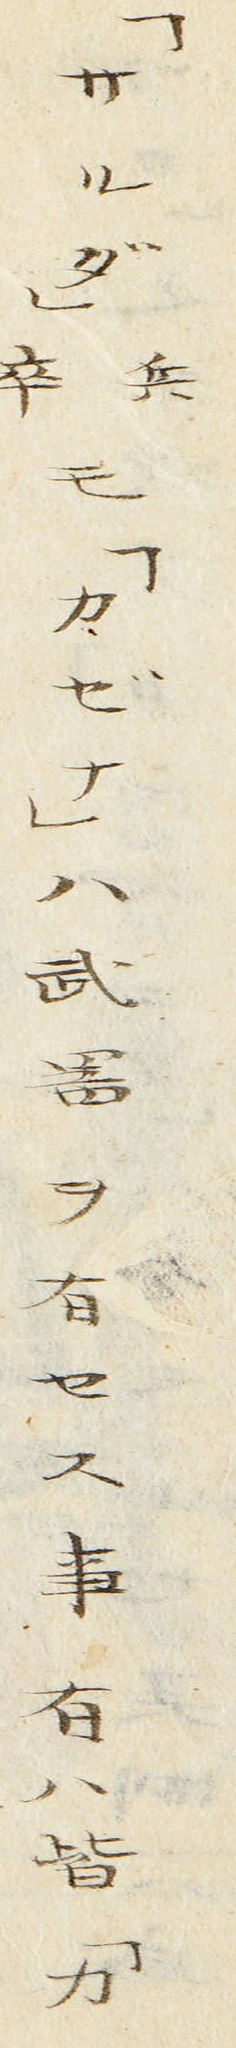「サルダ」兵卒モ「カゼナ」ハ武器ヲ有セス事有ハ皆「カ
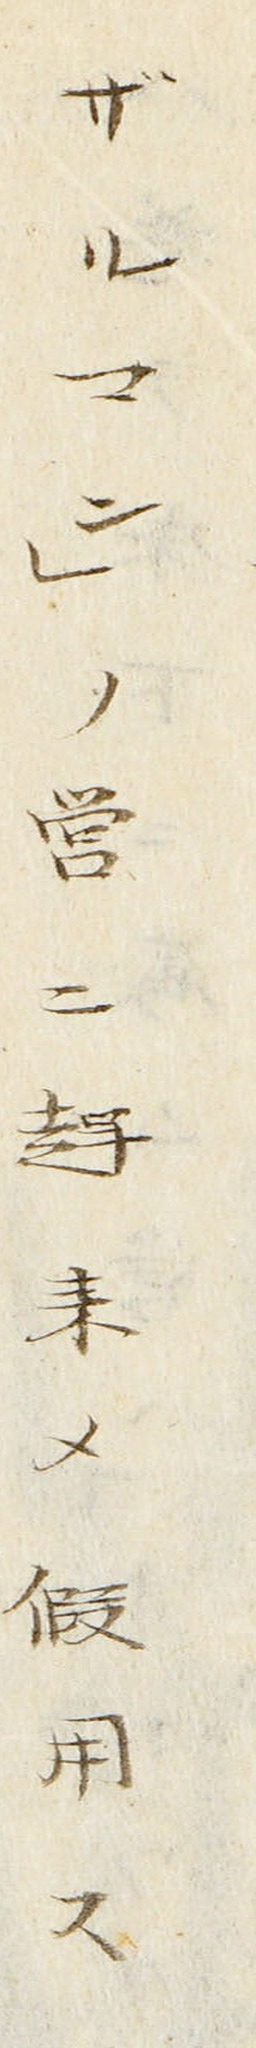ザルマン」ノ営ニ趕来シテ仮用ス
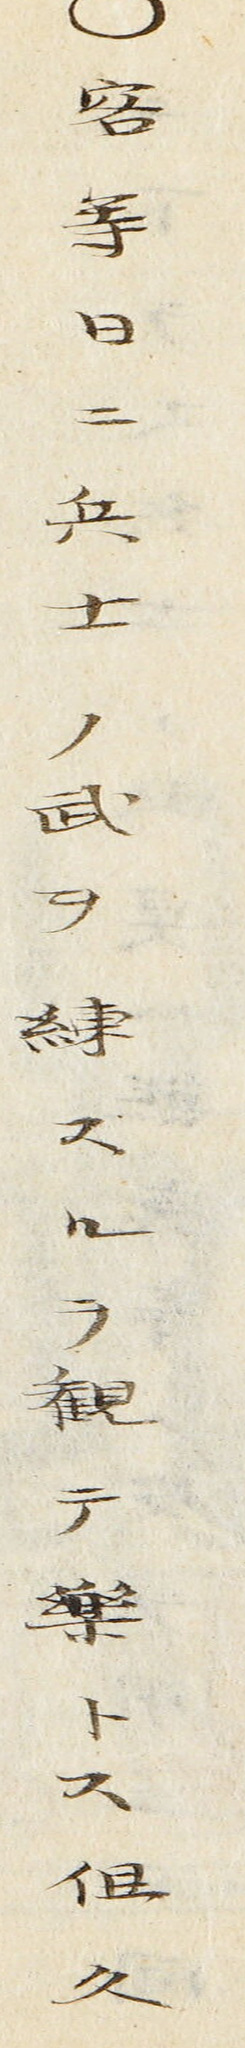○客等日ニ兵士ノ武ヲ練スルヲ観テ楽トス但久
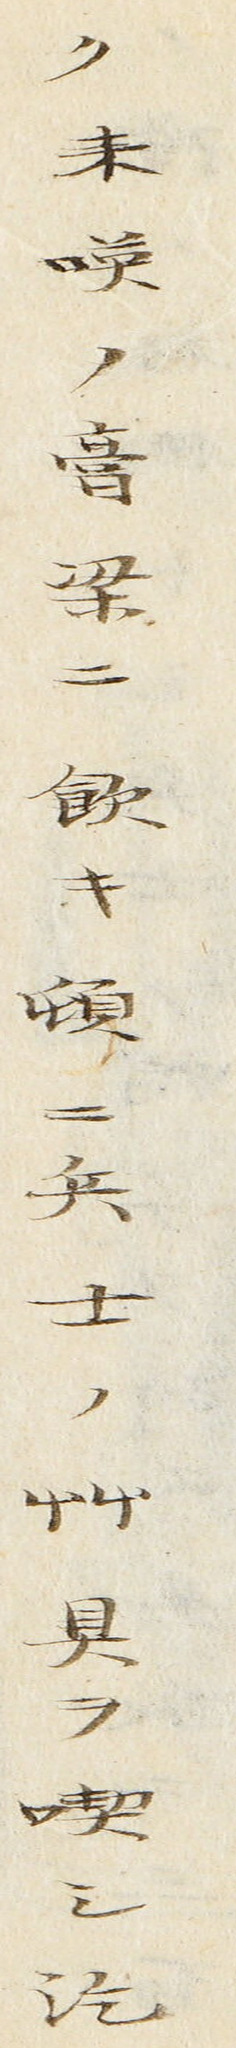ク来𠸄ノ膏梁ニ飲キ頓ニ兵士ノ艸具ヲ喫シ汔
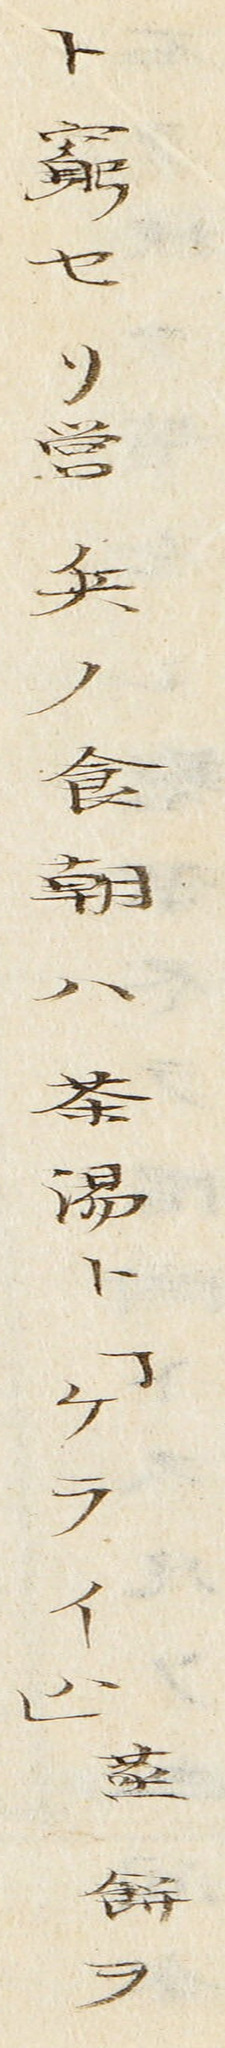ト窮セリ営兵ノ食朝ハ茶湯ト「ケライハ」蒸餅ヲ
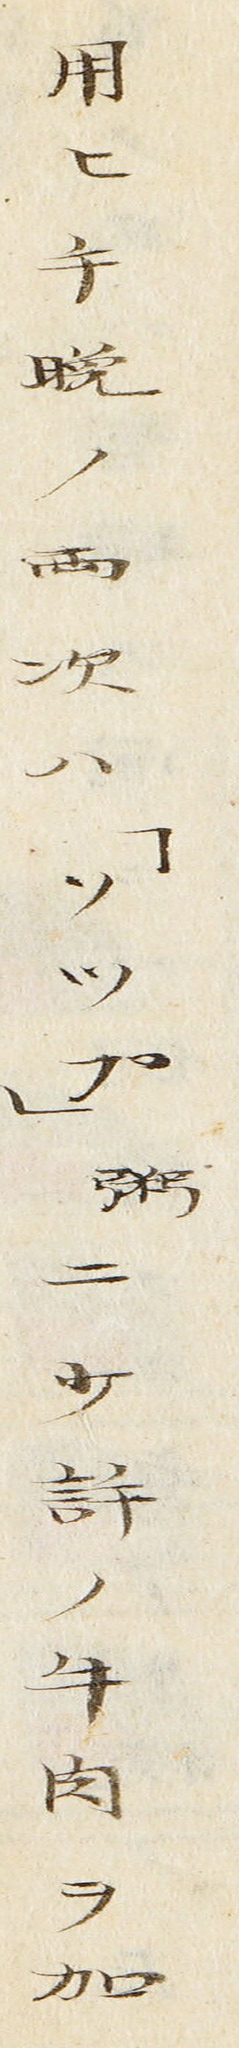用ヒ午晩ノ両次ハ「ソツプ」粥ニ少許ノ牛肉ヲ加
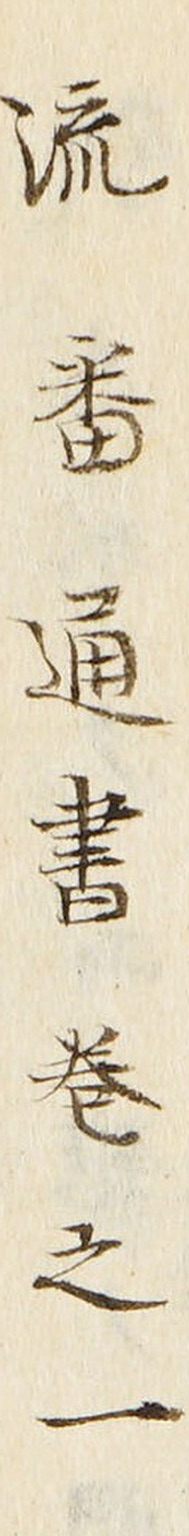流番通書巻之一

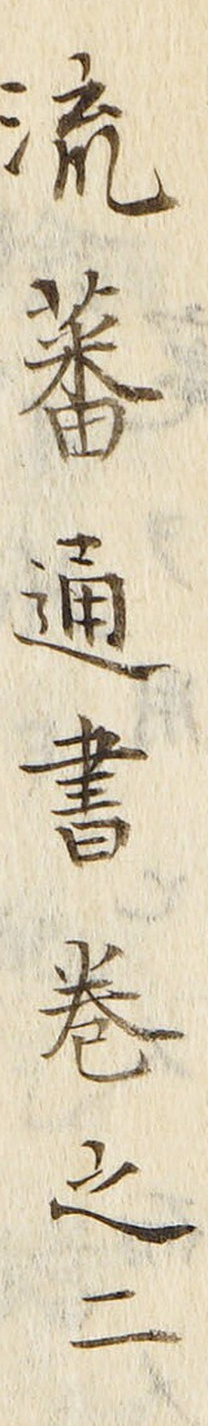流蕃通書巻之二
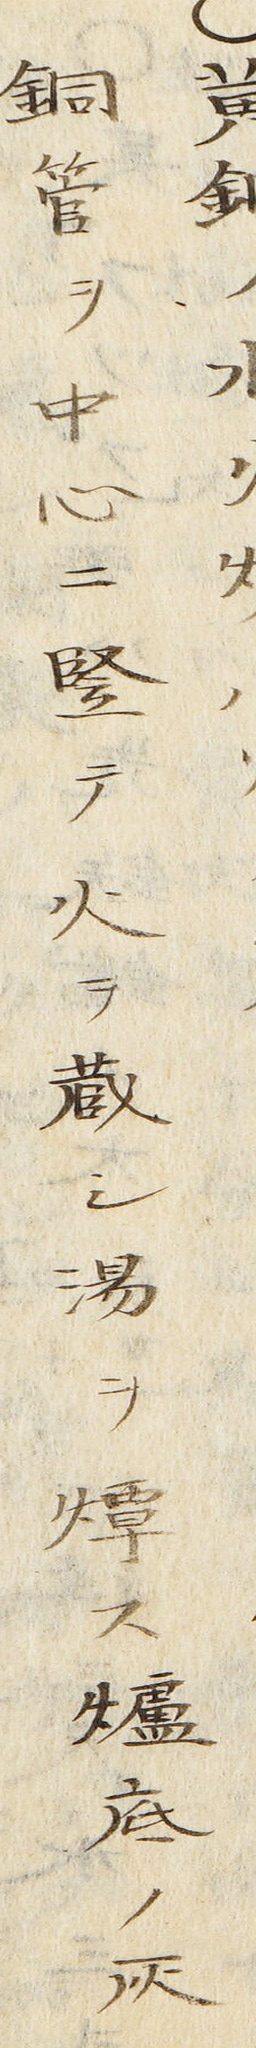銅管ヲ中心ニ竪テ火ヲ蔵シ湯ヲ燂ス爐底ノ灰
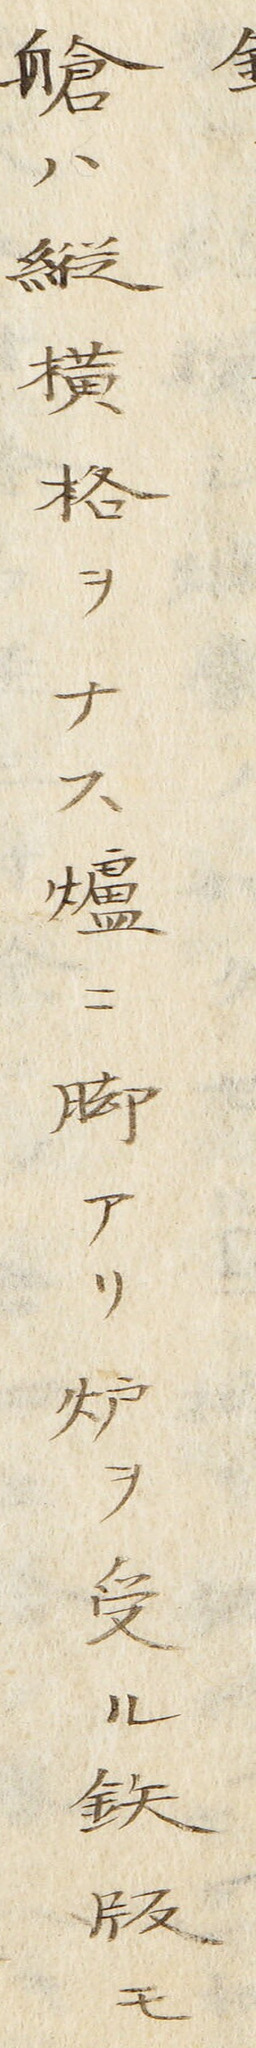艙ハ縦横格ヲナス爐ニ脚アリ炉ヲ受ル鉄版モ
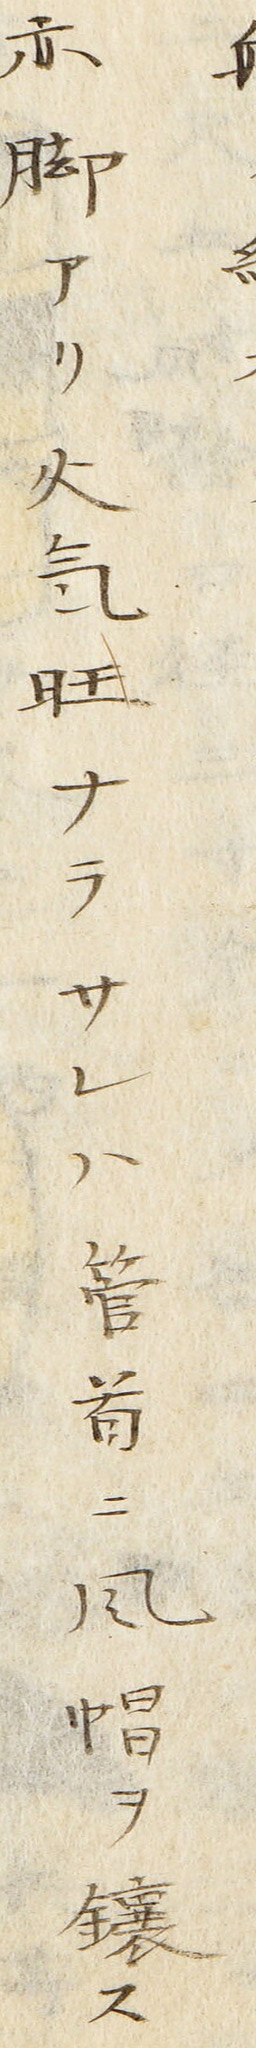亦脚アシ火気旺ナラサレハ管首ニ風帽ヲ鑲ス
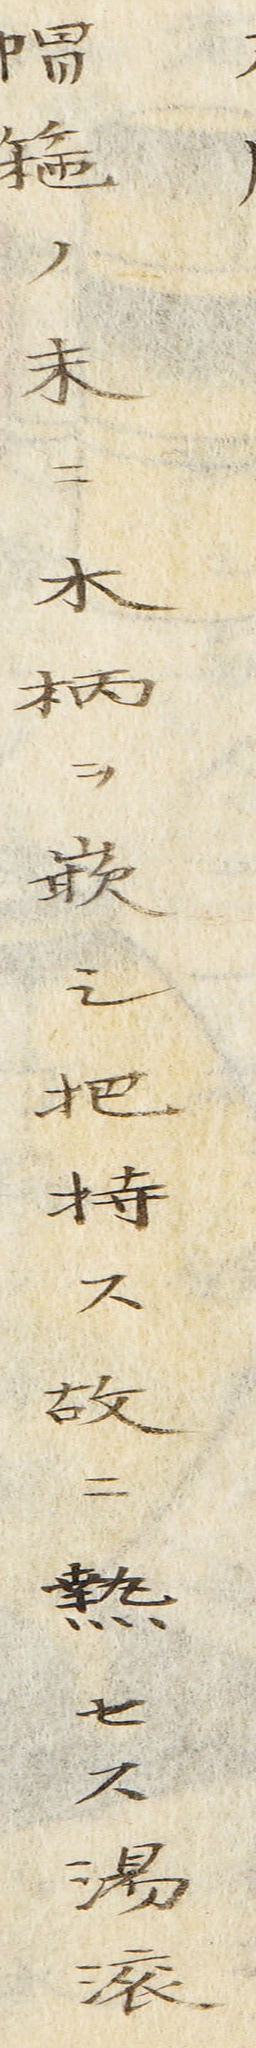帽箍ノ末ニ木柄ヲ嵌シ把持ス故ニ熱セス湯滾
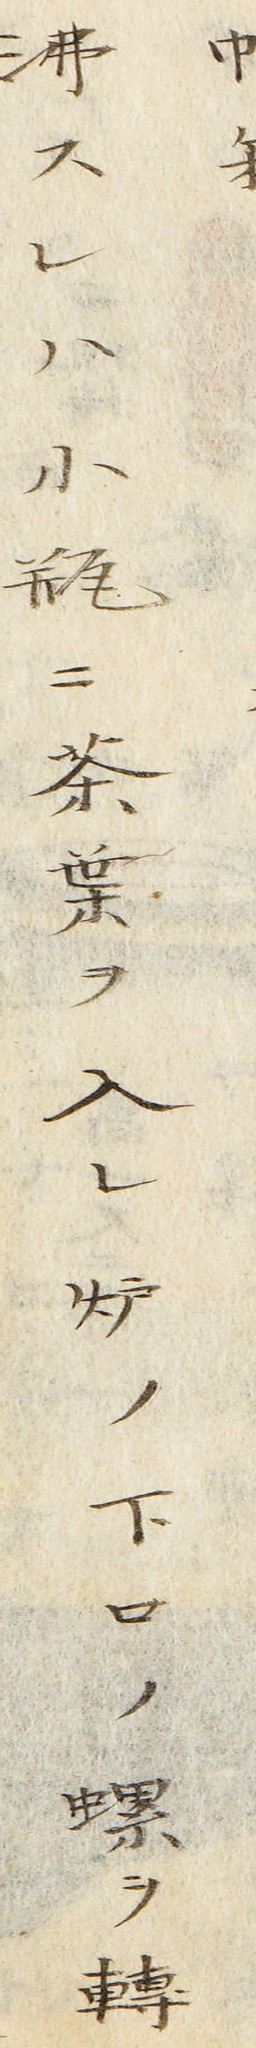沸スレハ小瓶ニ茶葉ヲ入レ炉ノ下口ノ螺ヲ転
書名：流蕃通書
